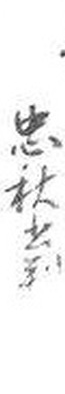忠秋書判
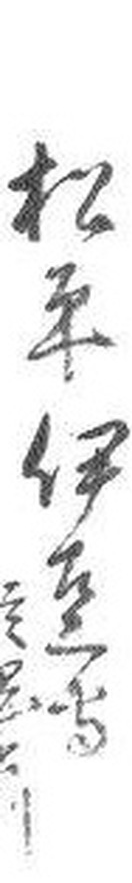松平伊豆守
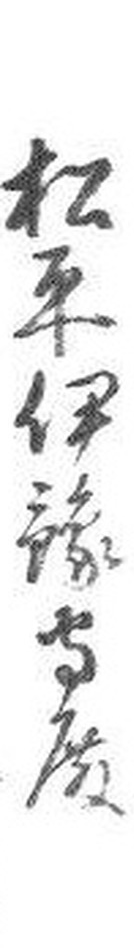松平伊豫守殿
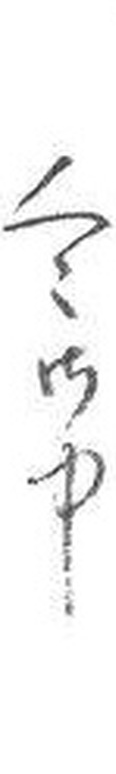人々御中
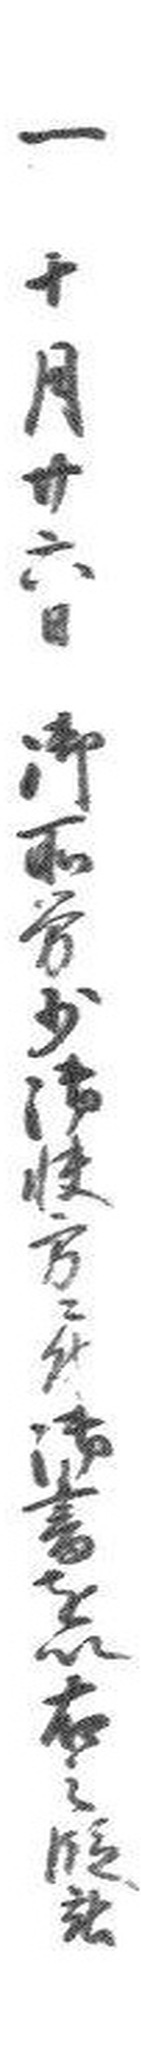一十月廿六日御所労少御快方ニ付御書を以右之段被
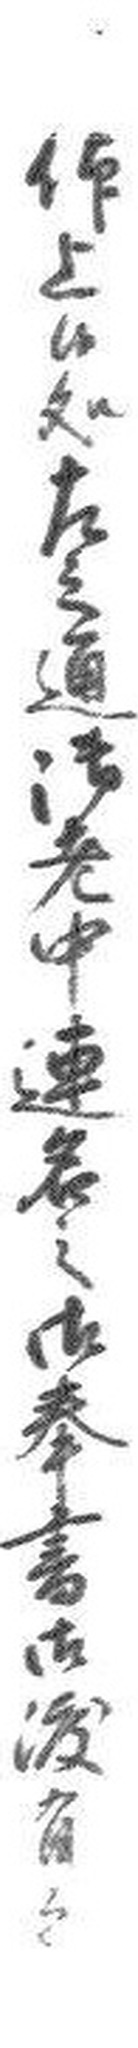仰上候処左之通御老中連名之御奉書御渡有之
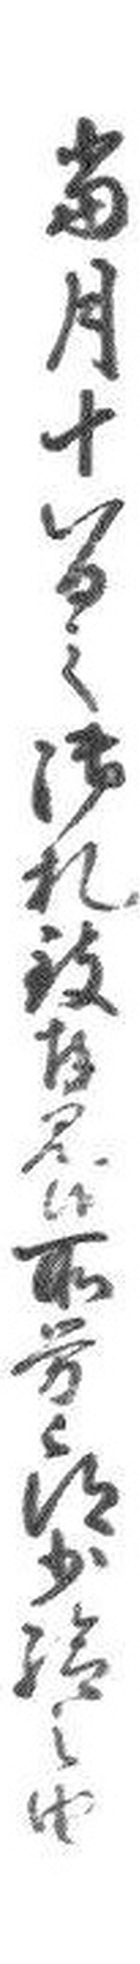当月十八日之御札致拝見候所労被得少験之由
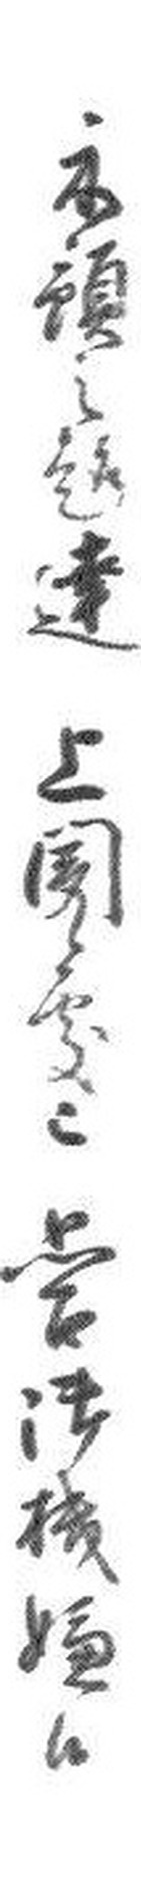示預之趣達上聞候処被思召御機嫌候
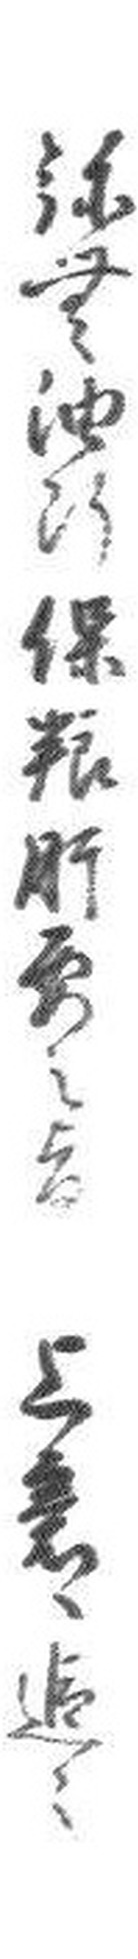弥無油断保養肝要之旨上意候追々
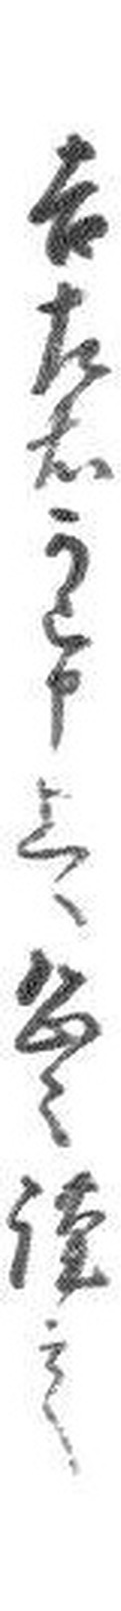吉左右可被申上候恐々謹言
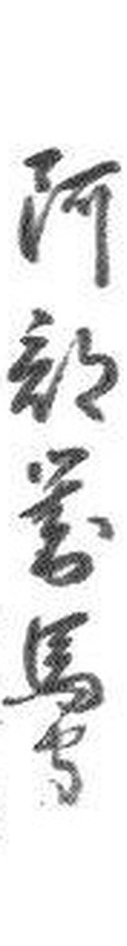阿部対馬守
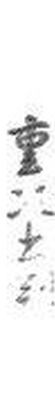重次書判
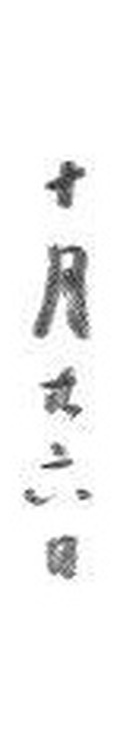十月廿六日
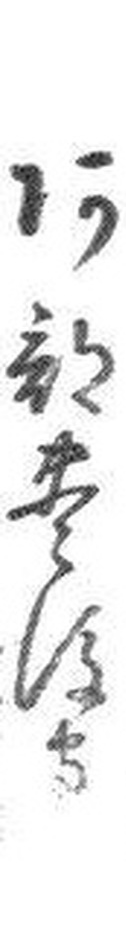阿部豊後守
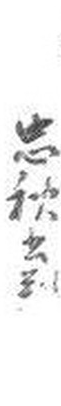忠秋書判
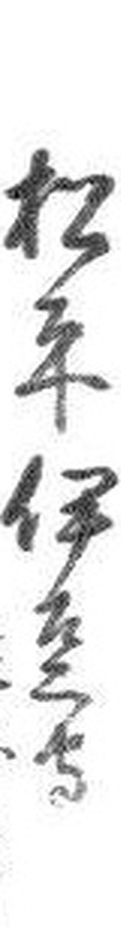松平伊豆守
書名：家譜 四 忠昌公 従寛永七年到正保四年
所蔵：福井県文書館 Fukui Prefectural Archives
